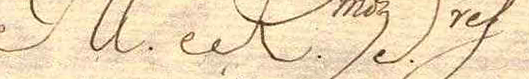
Ill.mos e R.moz S.res
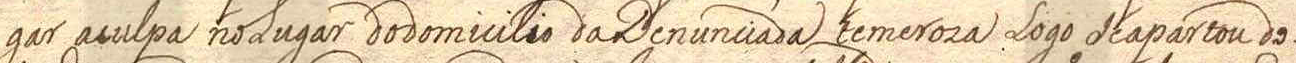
gar a culpa no Lugar do domicilio da Denunciada temeroza Logo se apartou do
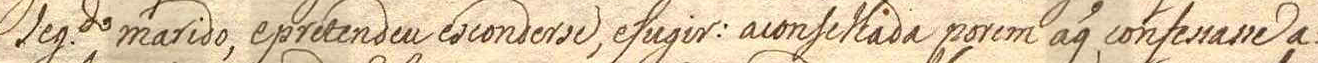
seg.do marido, e pretendeu esconderse, e fugir: aconselhada porem a q̄ confessasse a
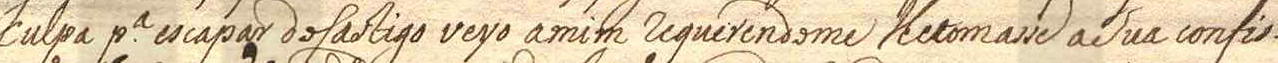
culpa p.a escapar do Castigo veyo a mim Requerendome lhe tomasse a sua confis
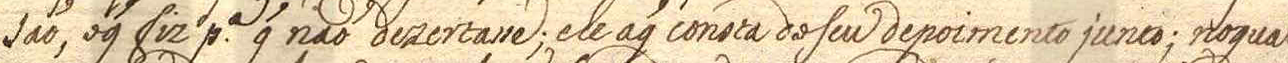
saõ, o q̄ fiz p.a q̄ naõ dezertasse; e he a q̄ consta do seu depoimento junto; no qual
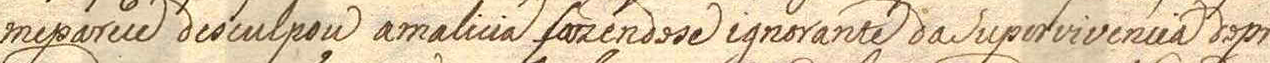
me parece desculpou a malicia fazendose ignorante da supervivencia do pr.o
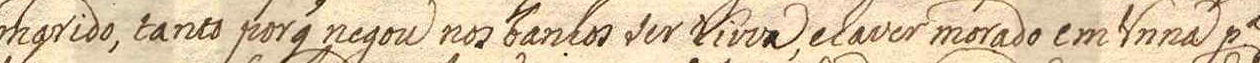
marido, tanto porq̄ negou nos banhos ser Vivva, e haver morado em Vnna p.a
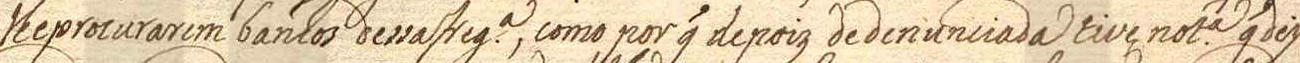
lhe procurarem banhos dessa freg.a, como porq̄ depoiz de denunciada tive not.a q̄ dey
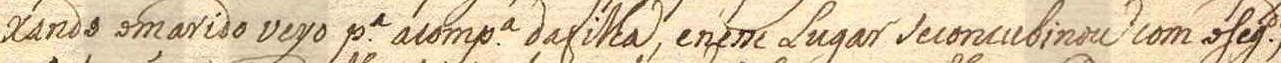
xando o marido veyo p.a a comp.a da filha, e nesse Lugar se concubinou com o seg.do,
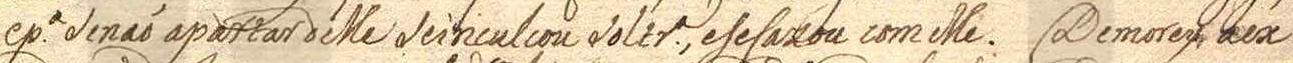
e p.a senaõ apartar delle se inculcou soltr.a, e se Cazou com elle. Demorey a ex
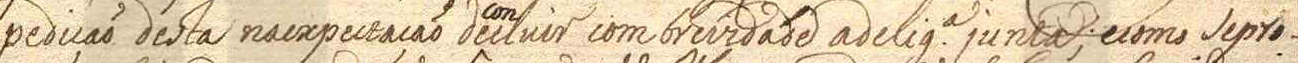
pediçaõ desta na expectaçaõ de concluir com brevidade a delig.a junta; e como se pro
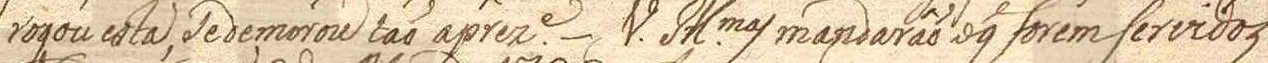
rogou esta, se demorou taõ aprez.e - V. Ill.mas mandarãó o q̄ forem servidoz
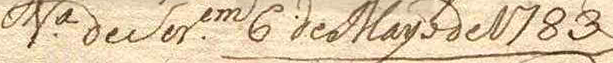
V.a de Ser.em 6 de Mayo de 1783
